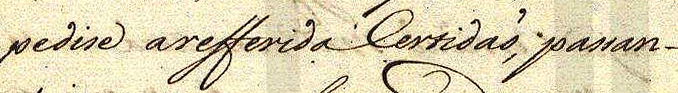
pedise a refferida Certidaõ, passan
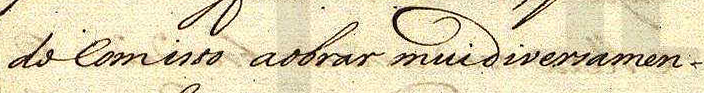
do com isso a obrar mui diversamen
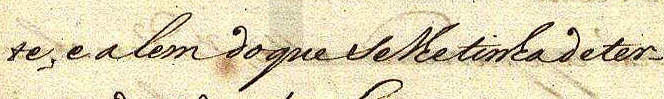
te, e alem do que se lhe tinha deter
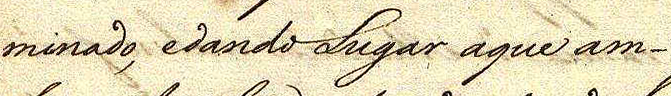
minado, e dando lugar a que am
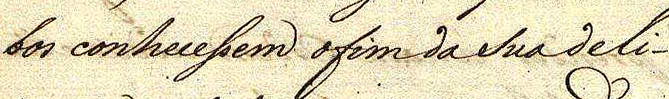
bos conhecessem o fim da sua deli
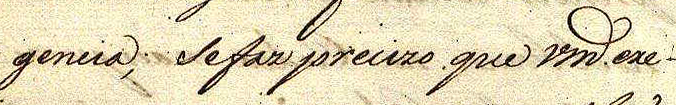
gencia; se faz precizo que v m.e exe
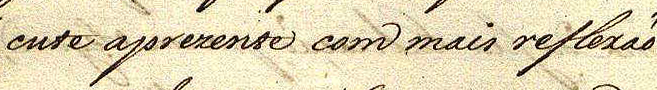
cute a prezente com mais reflexaõ
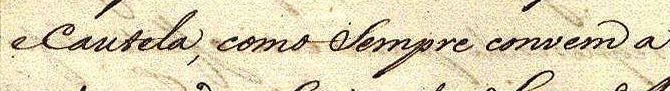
e Cautela, como Sempre convem a
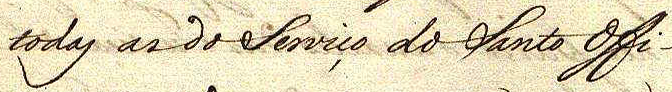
todas as do Serviço do Santo Offi
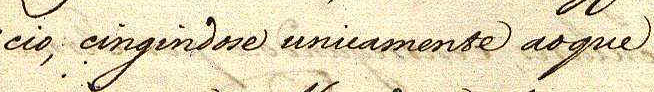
cio, cingindose unicamente ao que
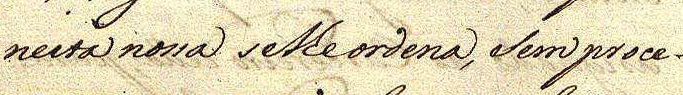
nesta nossa se lhe ordena, sem proce
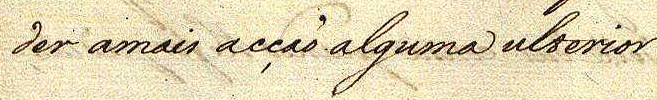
der a mais acçaõ alguma ulterior
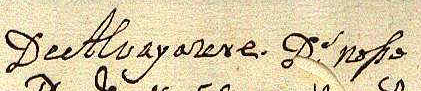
De Alvayazere. D.s nosso
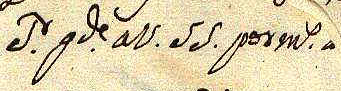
s.r g.de a V. S.S. por m̄. a
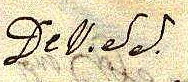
De V. SS.
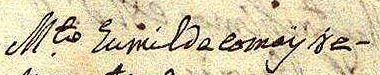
M.to humilde e o mais re
